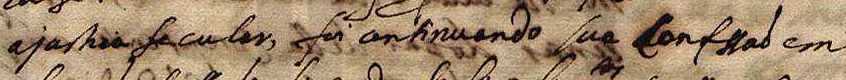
a justiça secular, foi continuando sua confissaõ em
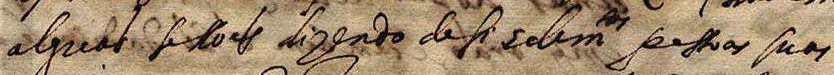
alguas sessoẽs dizendo de si E de mtas pessoas suas
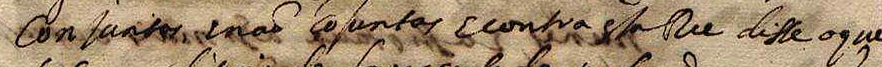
Conjuntas E naõ cojuntas E contra esta Ree disse o que
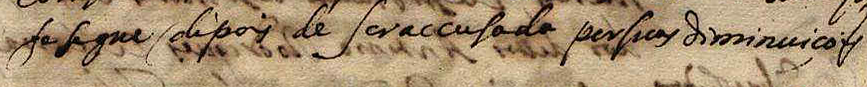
se segue dipois de ser accusada per suas diminuiçoẽs
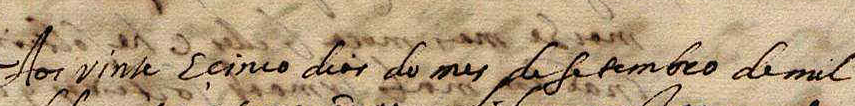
Aos vinte E cinco dias do mes de setembro de mil
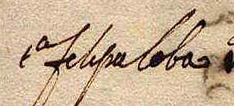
ta felipa loba
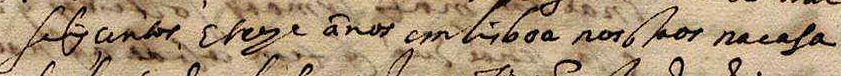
seiscentos E treze ānos em lisboa nos staos na casa
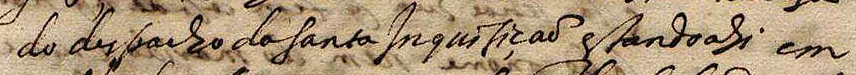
do despacho da santa Jnquisiçaõ estando ahi em
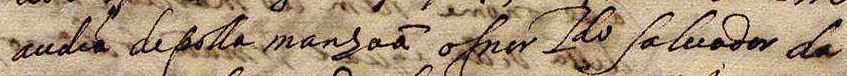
audiā de polla manhaā o snor̄ Ldo Saluador da
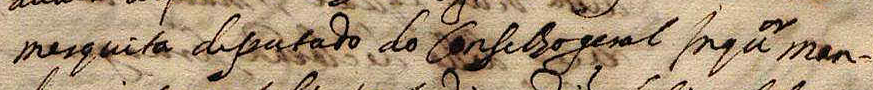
mesquita deputado do Conselho geral Jnquor man
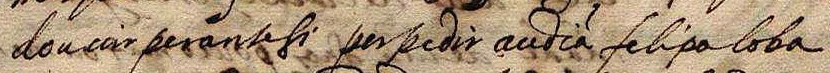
dou uir perante si por pedir audiā felipa loba
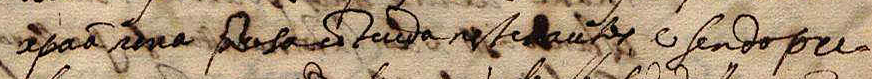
xpaā noua presa cōteuda neste autos, e sendo pre
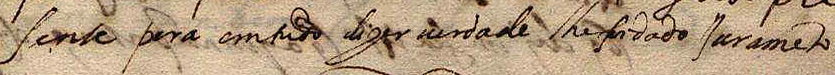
sente pera em tudo dizer uerdade lhe foi dado Juramēto
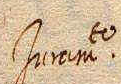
Juram.to
